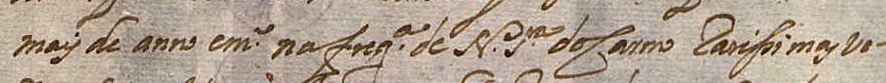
mais de anno e m.o na freg.a de N. s.ra do Carmo Rarissimas ve
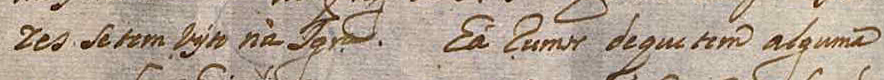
zes se tem visto na Igra. há Rumor de que tem alguma
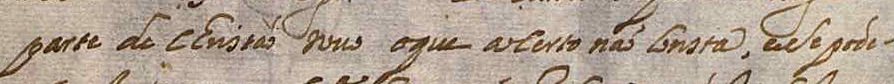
parte de christaõ nouo o que ao certo naõ consta, e se pode
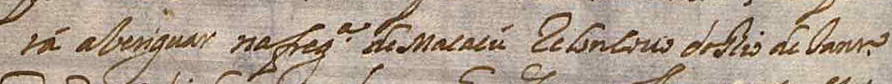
rá averiguar na freg.a de Macacú Renoncouo do Rio de Ianr.o
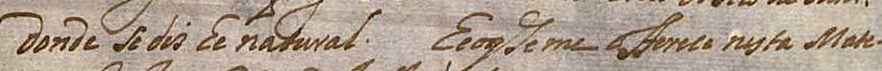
donde se dis he natural. he o q̄ se me offerece nesta Mate
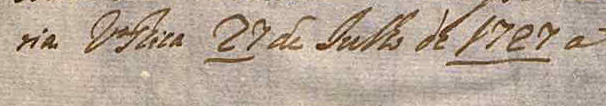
ria Va Rica 27 de Iulho de 1727 ā
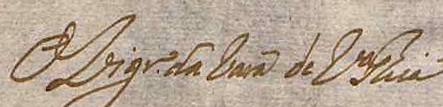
O Vigr.o da Vara de Va Rica
